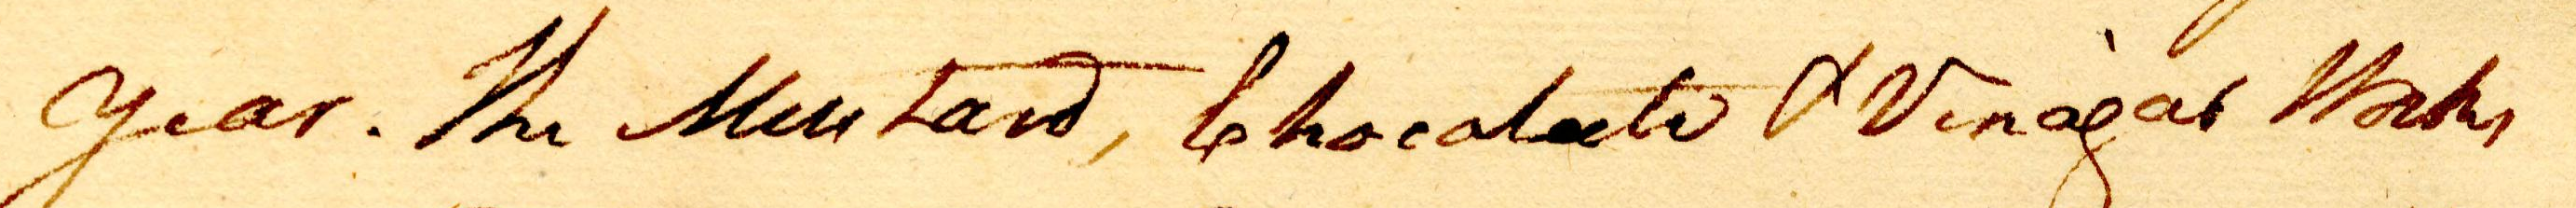year. The Mustard, Chocolate & vinegar Works
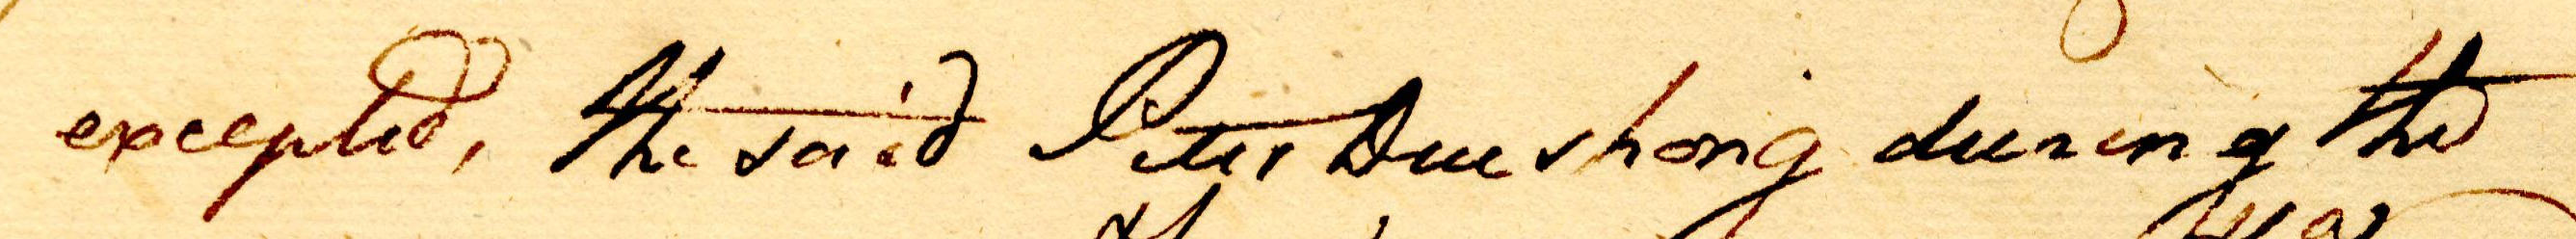excepted, the said Peter Dueshong during the
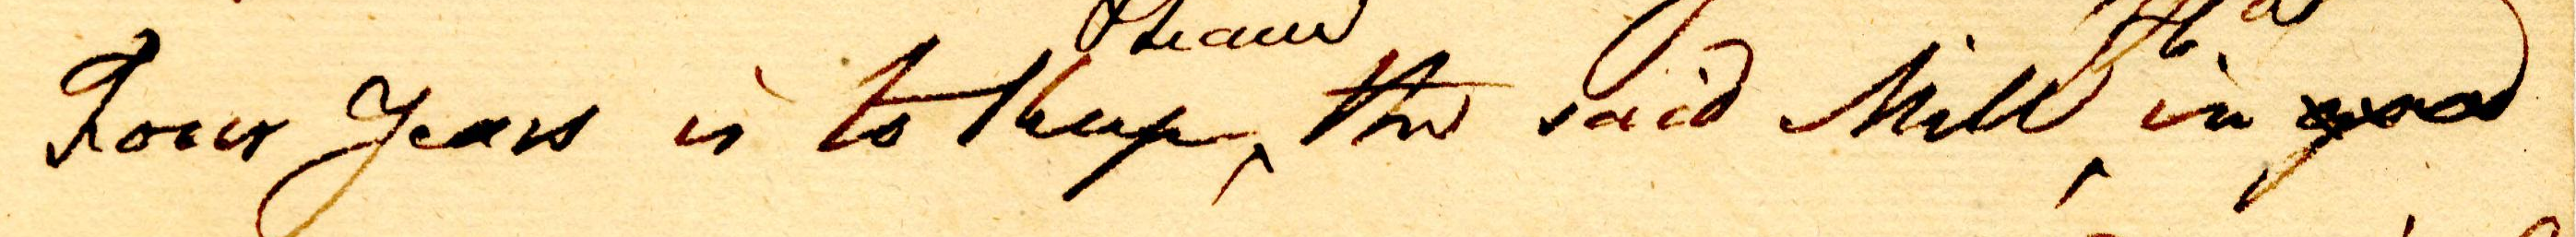Four Years is to keep the said Mill in [good]
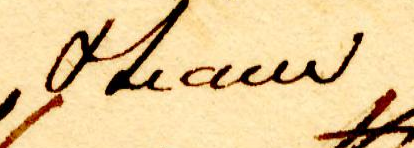& have
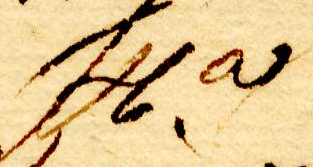&c^a
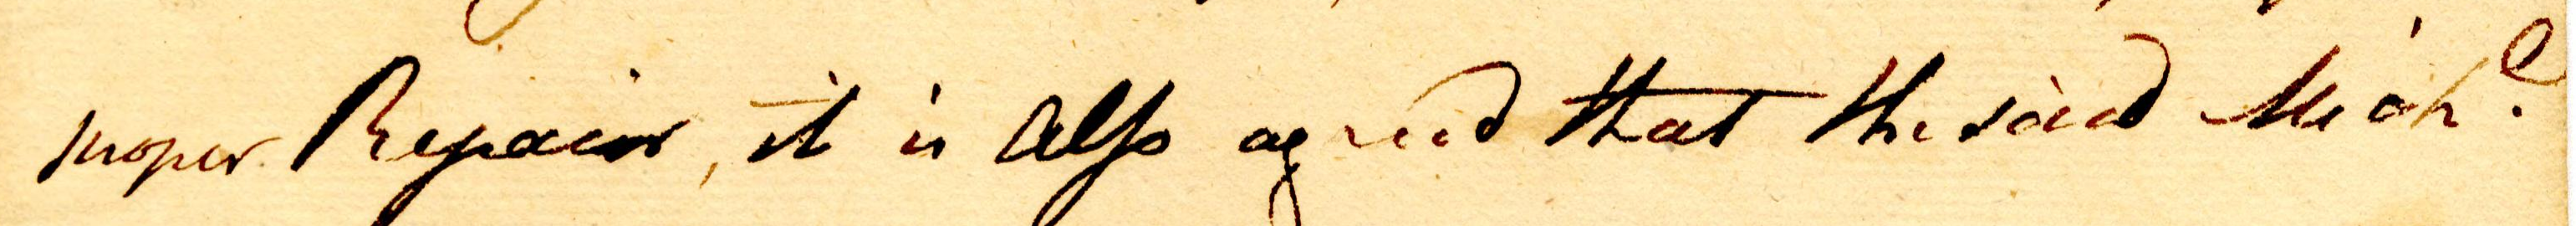proper Repair, it is Also agreed that the said Mich^l
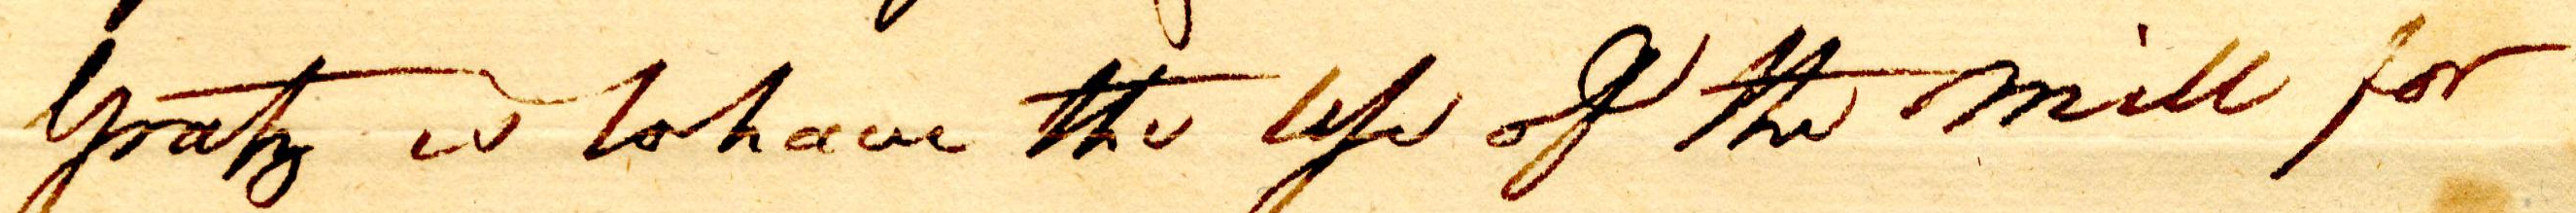gratz is to have the use of the mill for
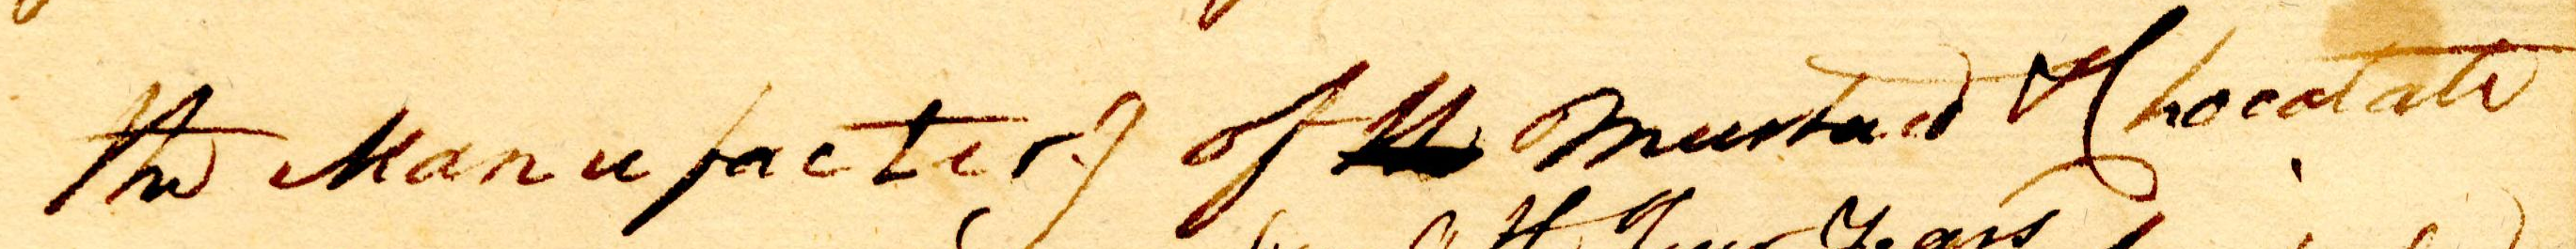the Manufactur^g of [_] mustard & Choolate
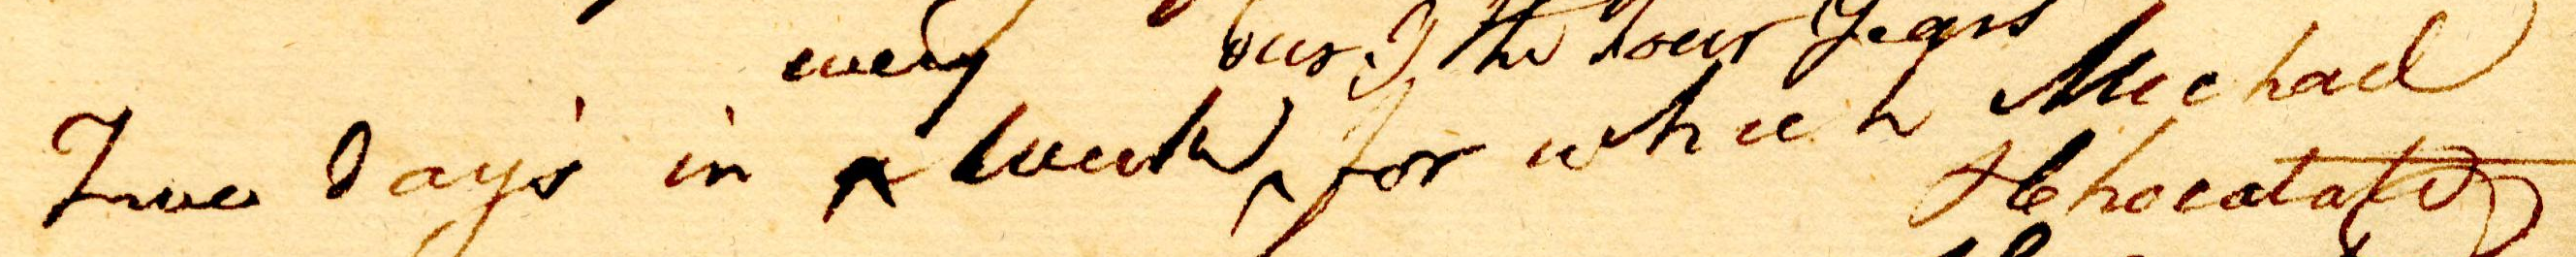Five days in ^ week for which Michael
